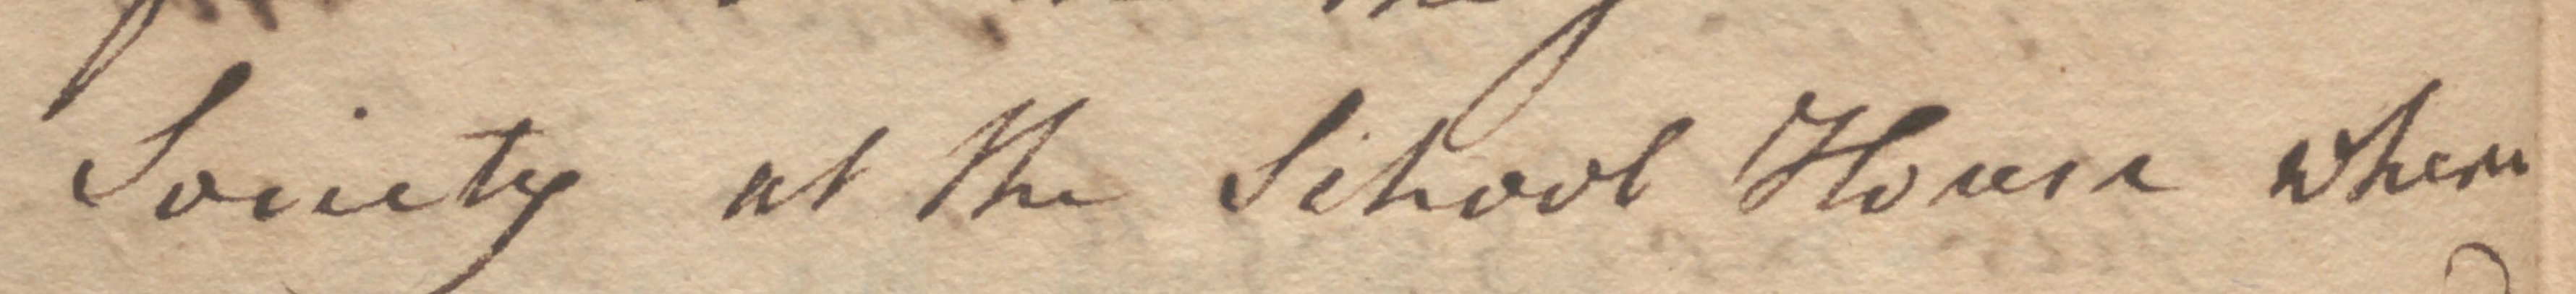Society at the School House where
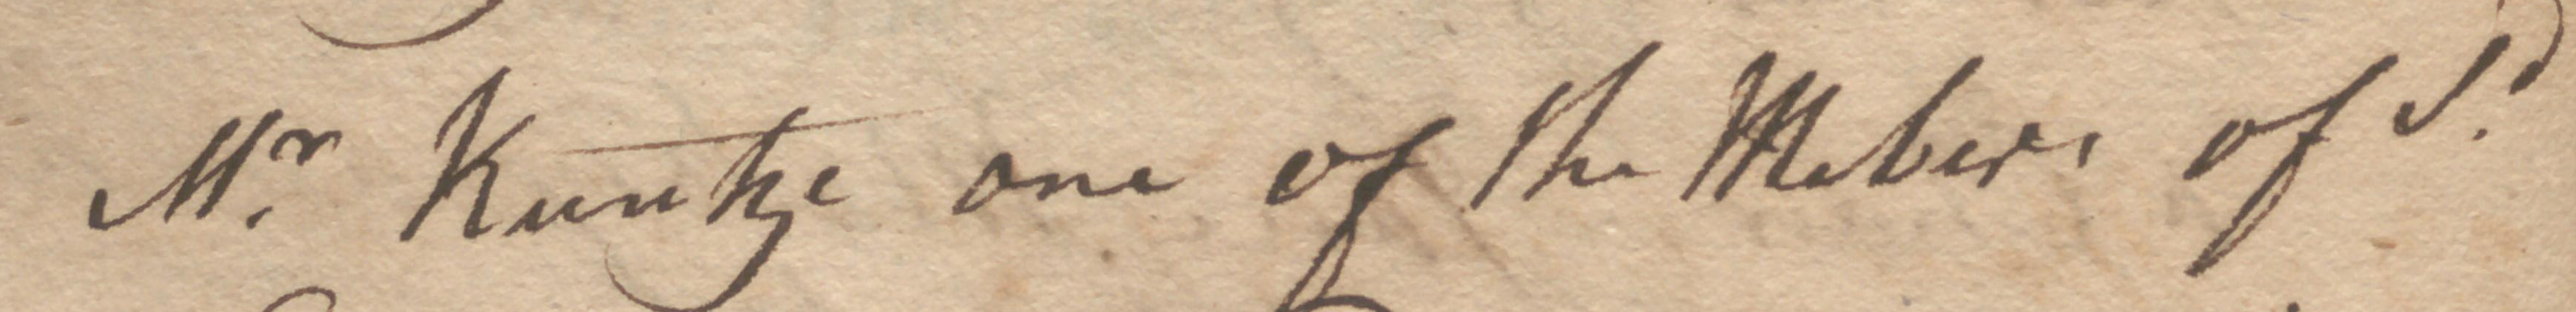M^r. Kuntze one of the Mebers of S^d.
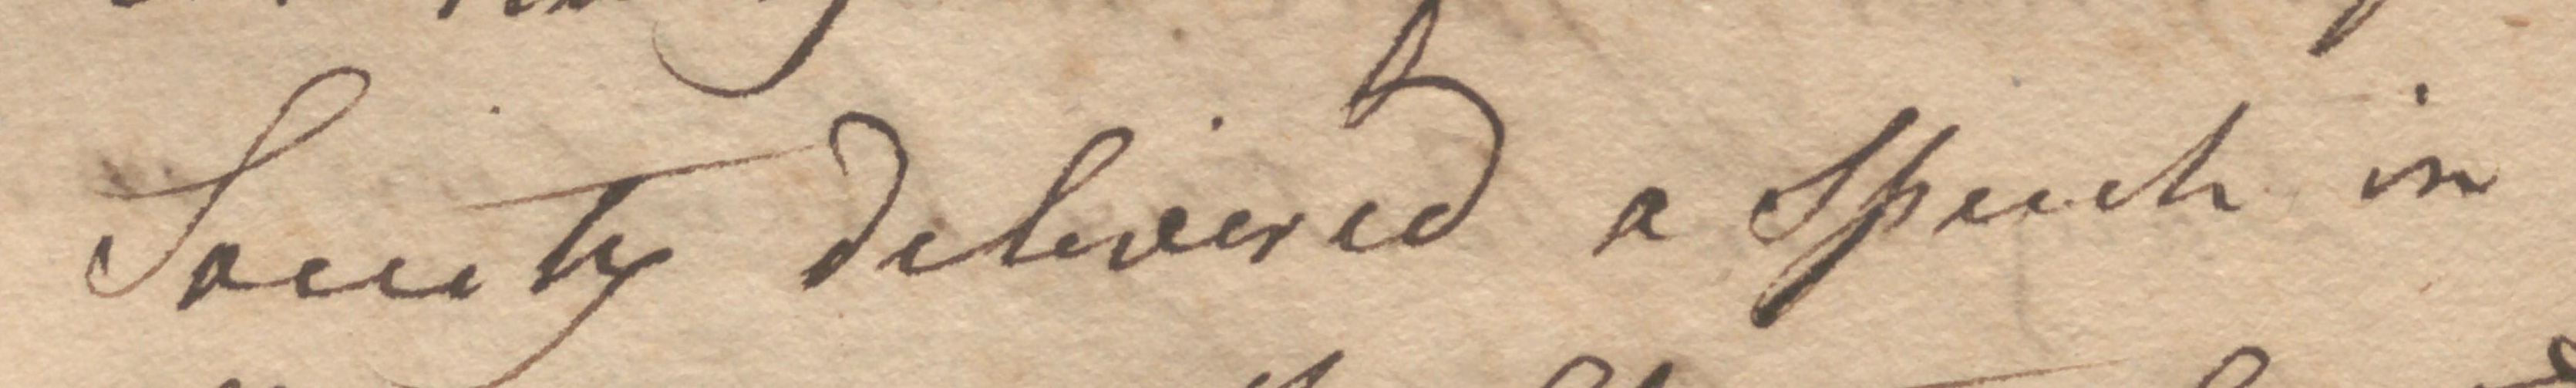Society delivered a Speech in
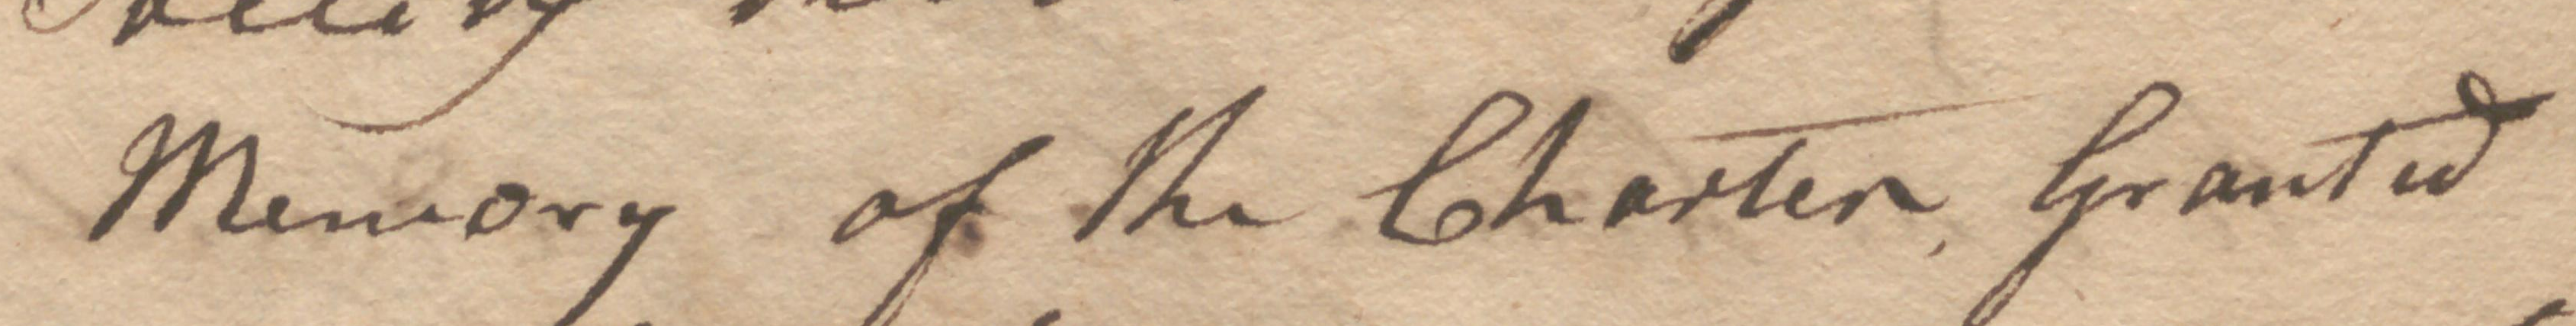Memory of the Charter Granted
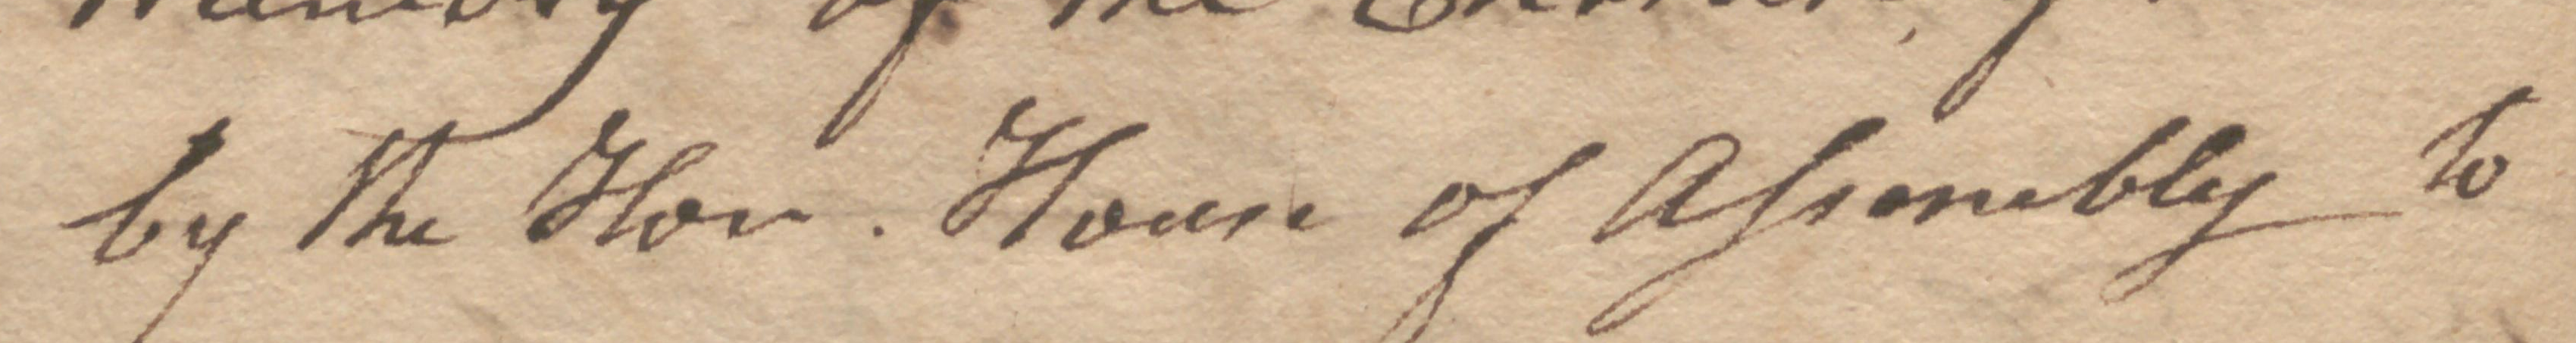by the Hon. House of Assemebly to
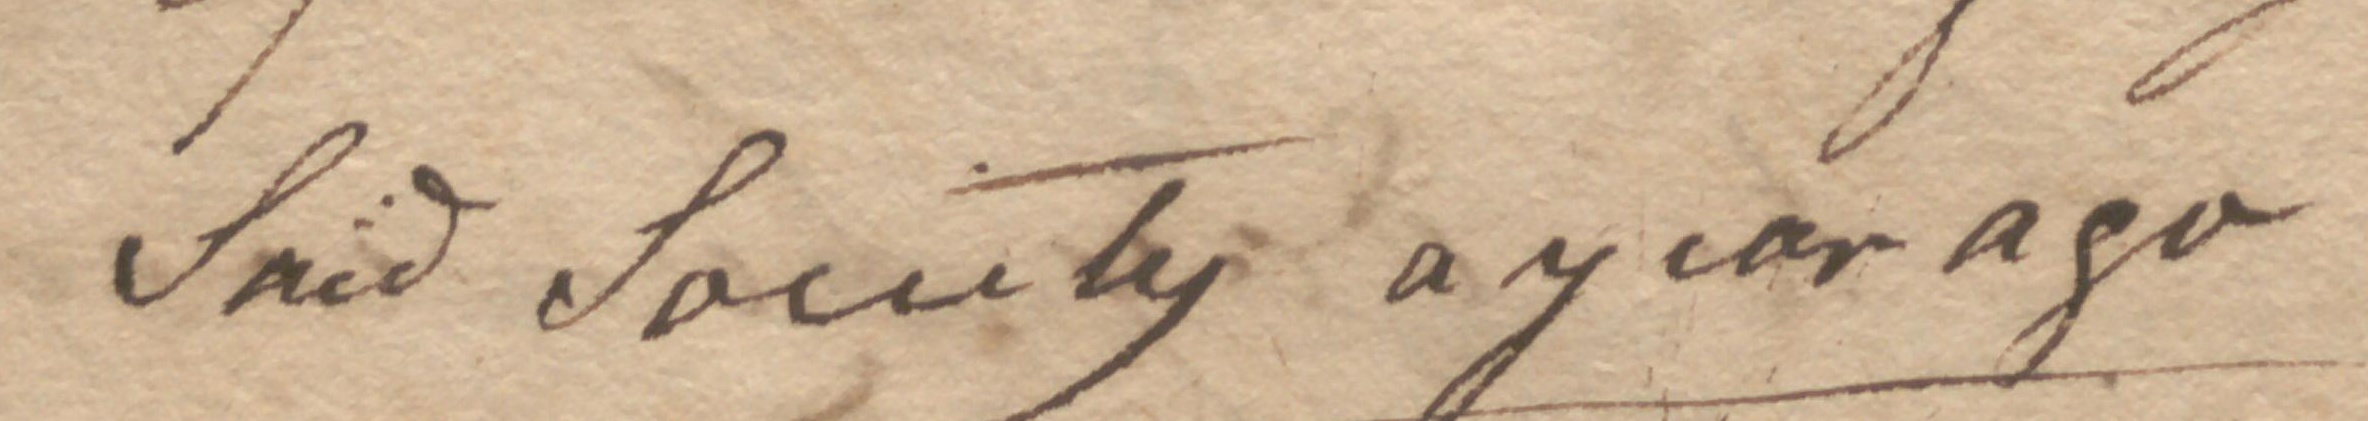Said Sociely a year ago
